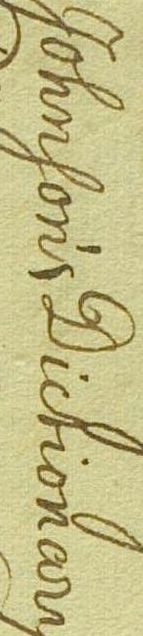Johnson's Dictionary
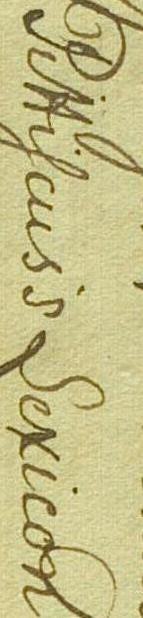P Miscus's Lexicon
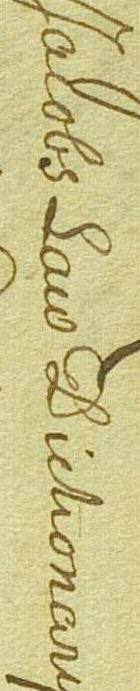Jacobs Law Dictionary
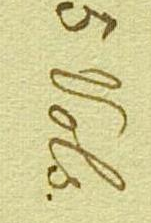5 Vols.
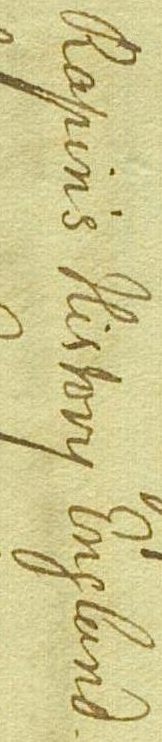Rapin's History England
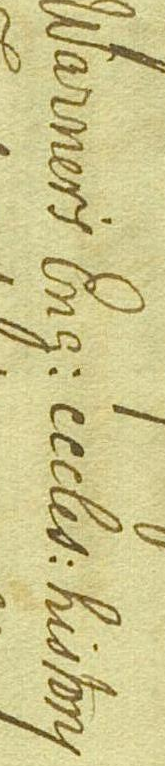Warner's Eng: eccles: history
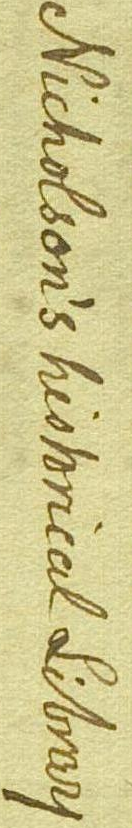Nicholson's historical Library
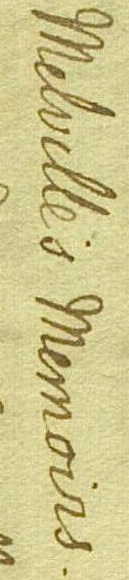Melville's Memoirs.
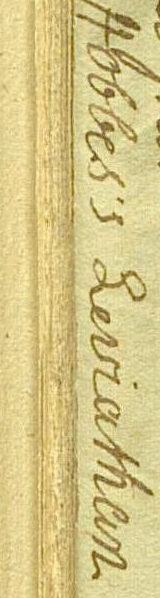Hobbes's Leviathan
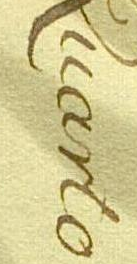Quarto
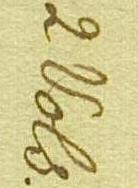2 Vols.
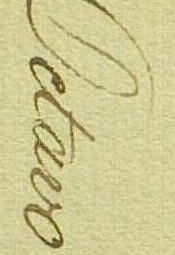Octavo
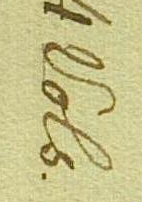4 Vols.
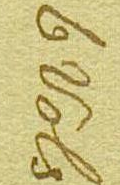6 Vols
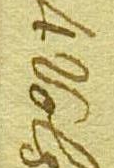4 Vols
